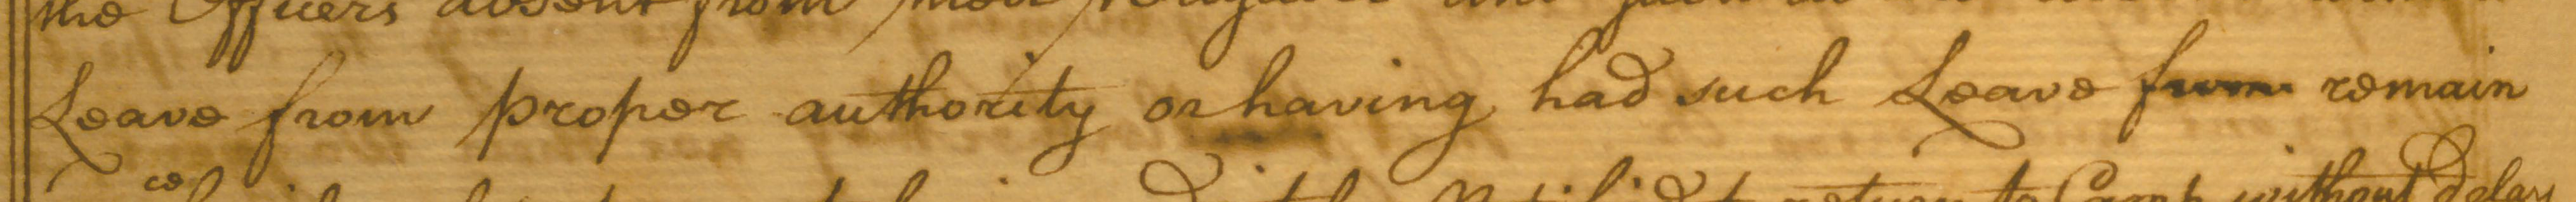Leave from proper authority or having had such Leave remain
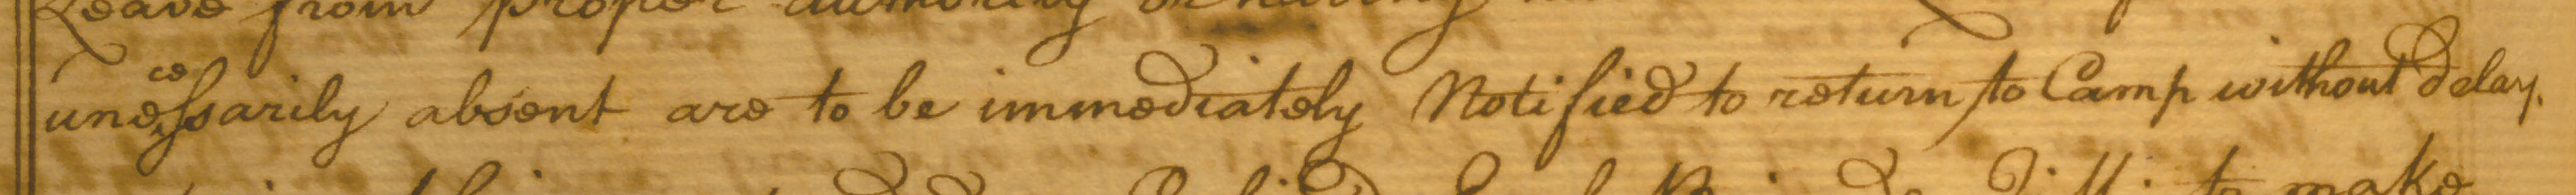une^cessarily absent are to be immediately Notified to return to Camp without delay.
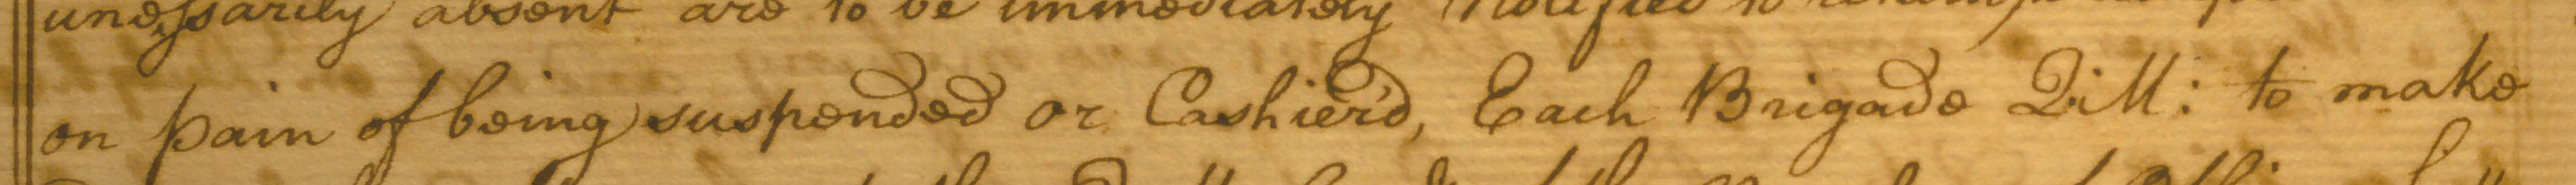on pain of being suspended or Cashier'd, Each Brigade Q:M: to make
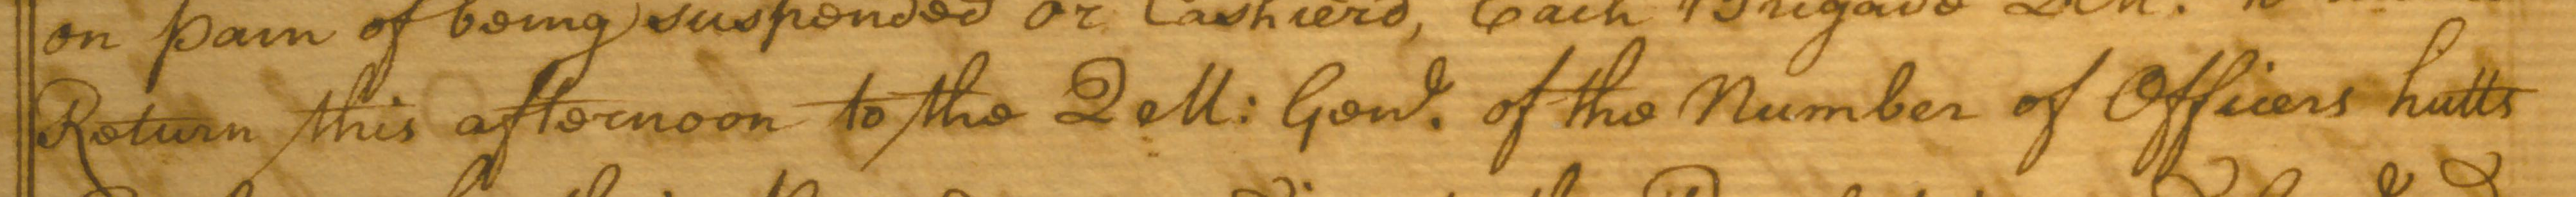Return this afternoon to the QM: Gen^l. of the Number of Officers hutts
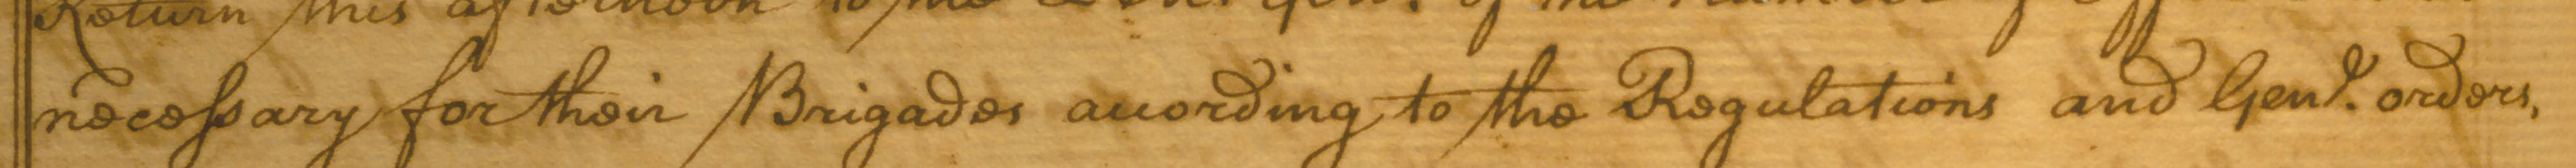necessary for their Brigades according to the Regulations and Gen^l. orders.
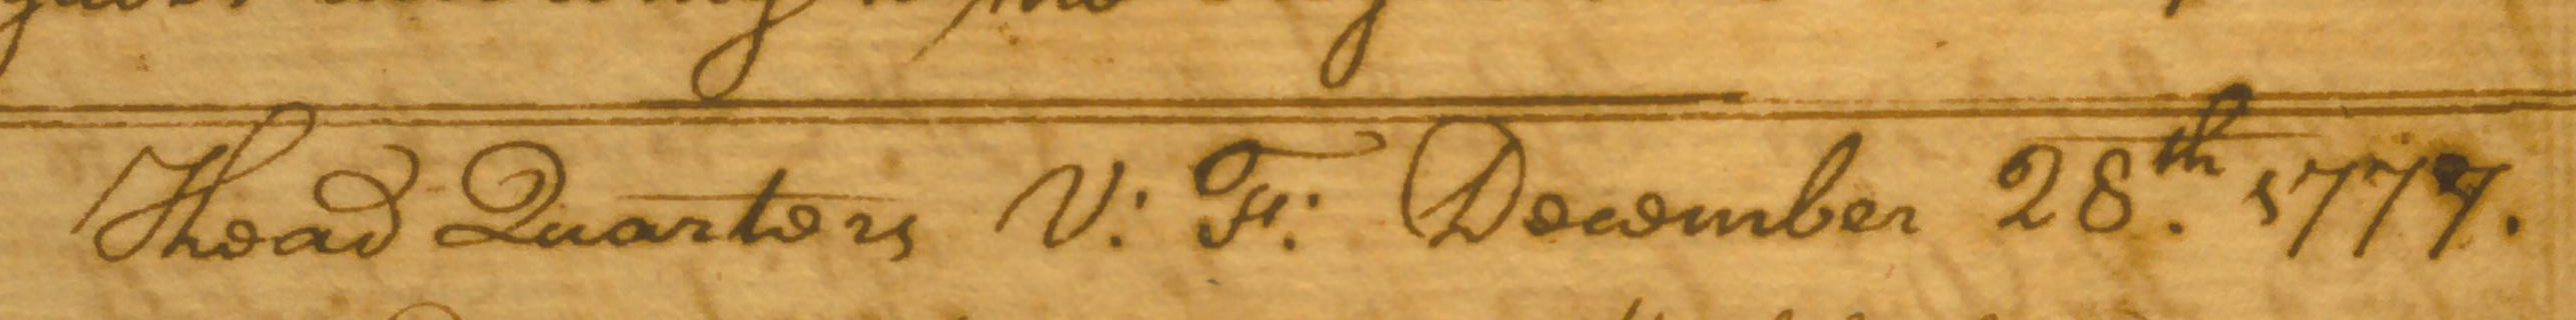Head Quarters V; F; December 28^th. 1777.
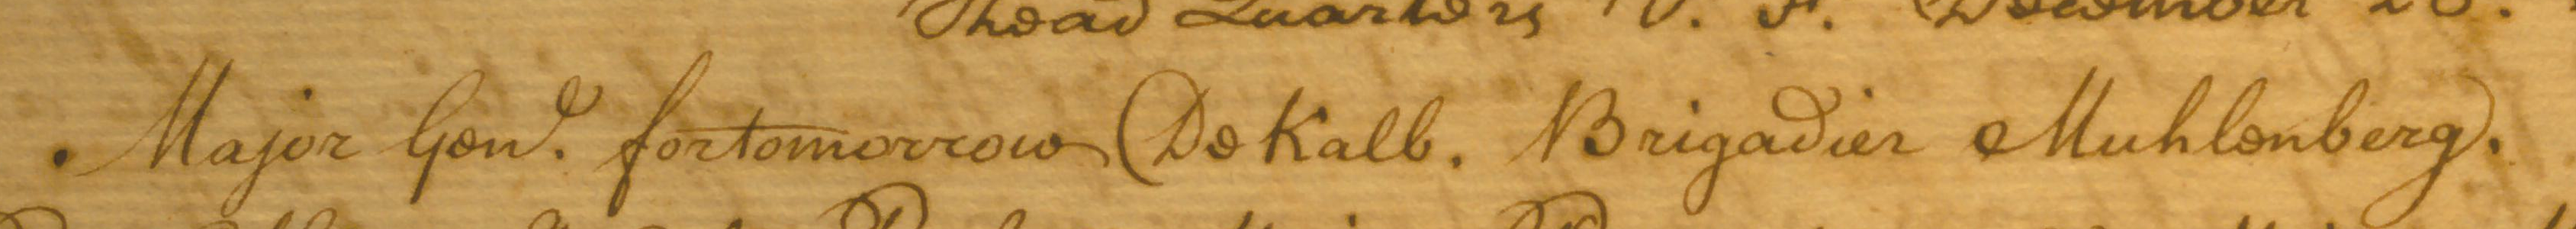Major Gen^l. for tomorrow De Kalb. Brigadier Muhlenberg.
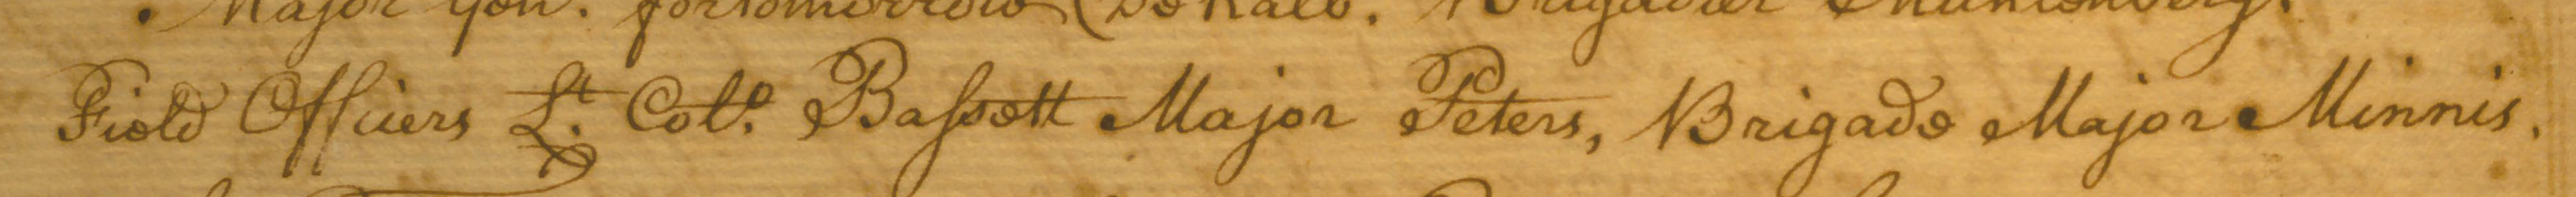Field Officers L^t. Col^o. Bassett Major Peters, Brigade Major Minnis
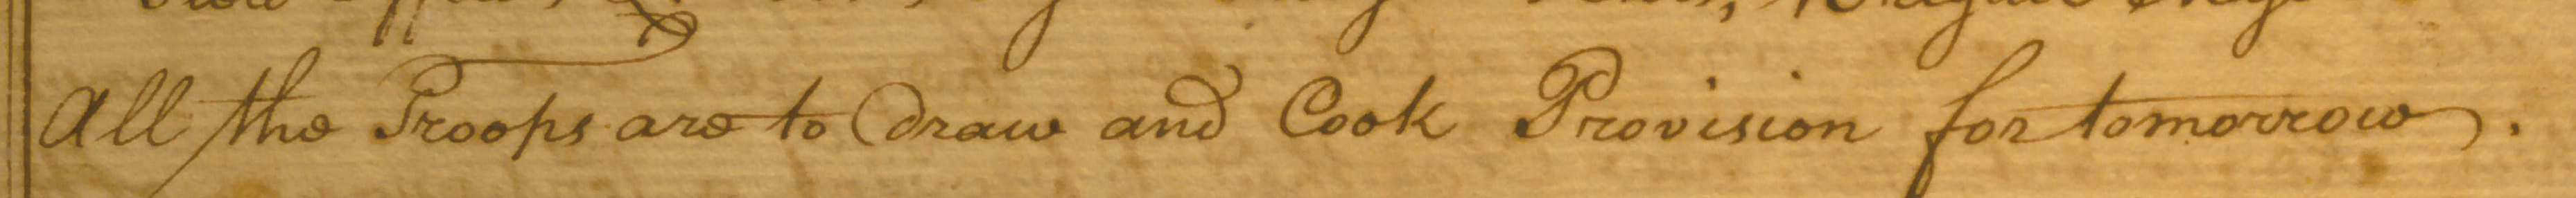All the Troops are to draw and Cook Provisions for tomorrow.
